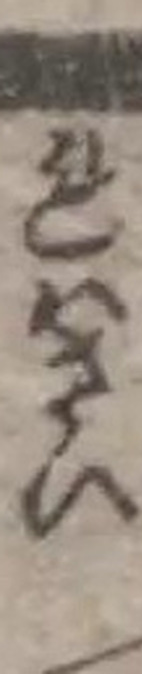れはさい
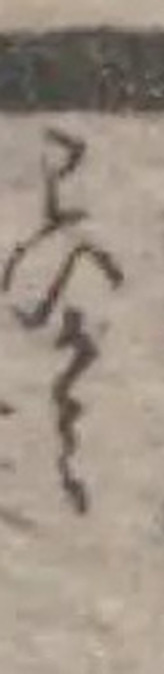わいかみ
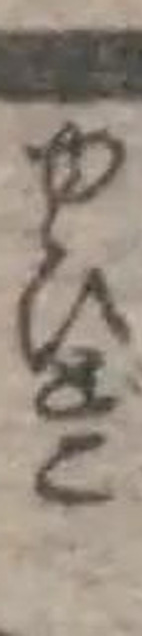ゆひどこ
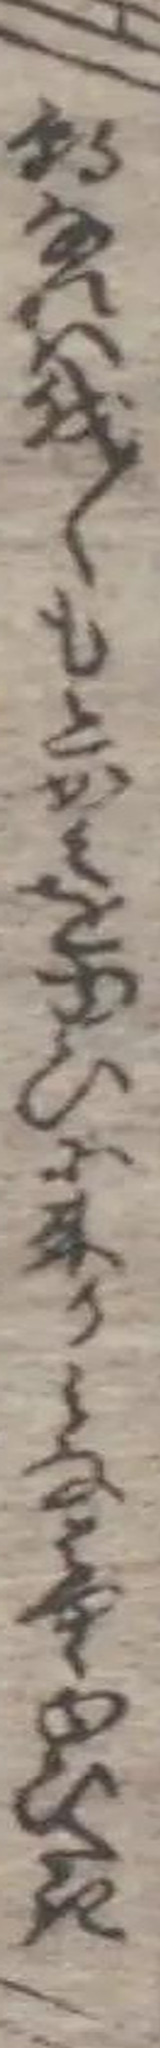朝なれは我〳〵もとかみをゆひに来りみなはやくゆひたき
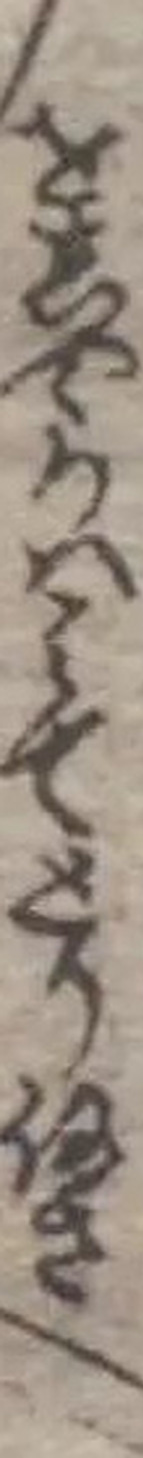をしやかはみてとり何さ
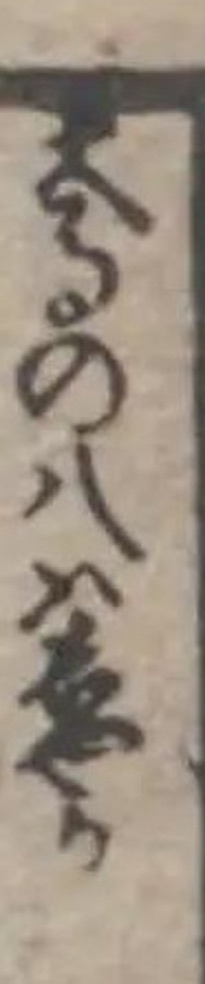大間の八はしやか
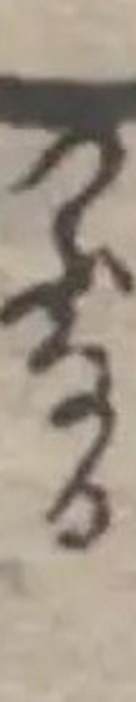つふなる
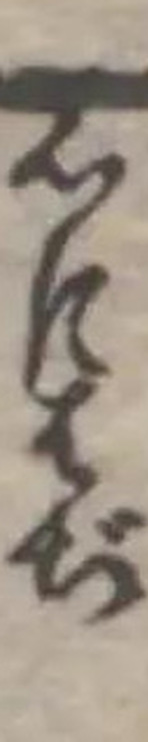心にはぢ
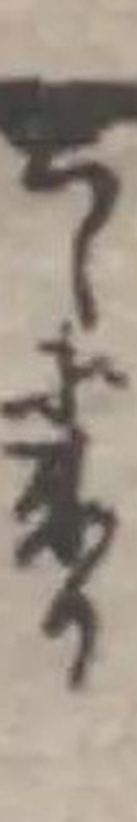こゝに来り
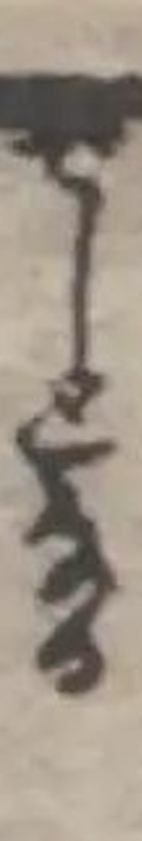でしとなる
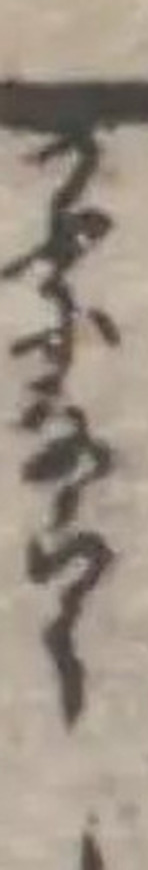つふにならう
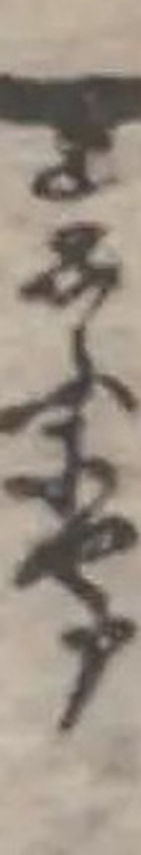と思ふにやア
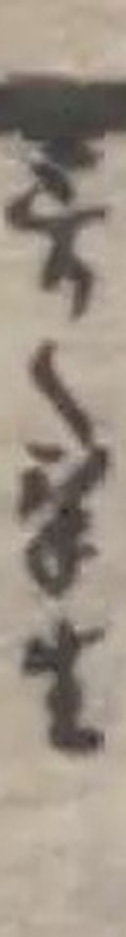とかく気生
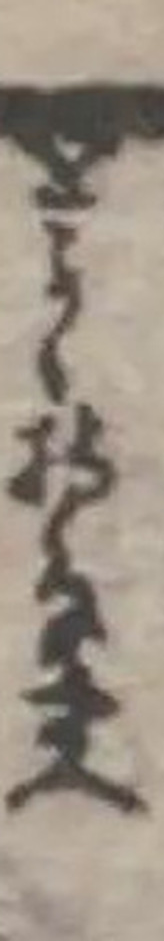をよく持給まへ
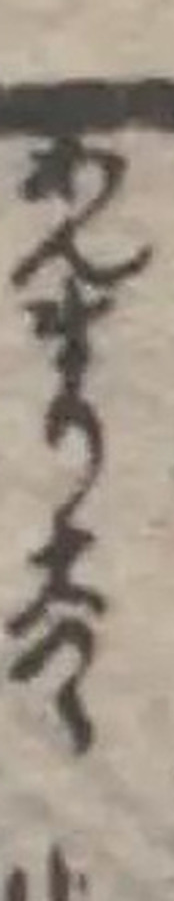あんまり大つら
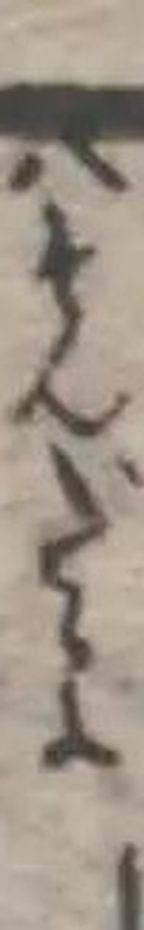八そんだよ
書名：早出来 3巻
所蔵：国立国会図書館 National Diet Library, JAPAN
